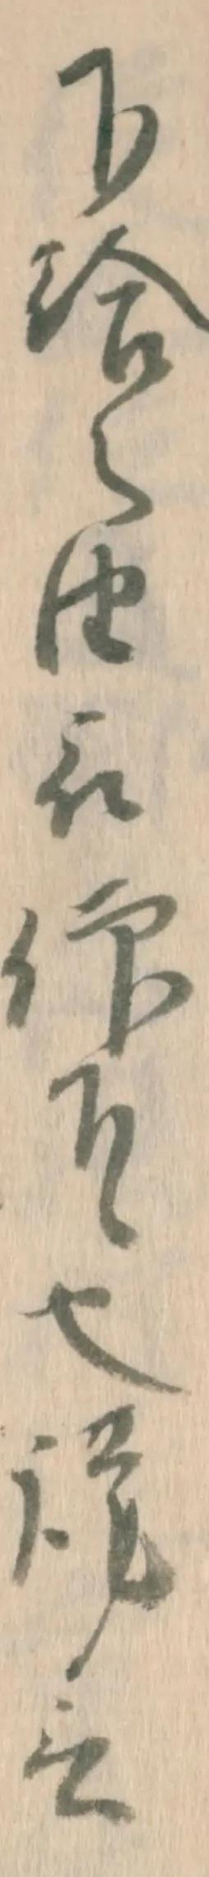下給之由被仰下候也謹言
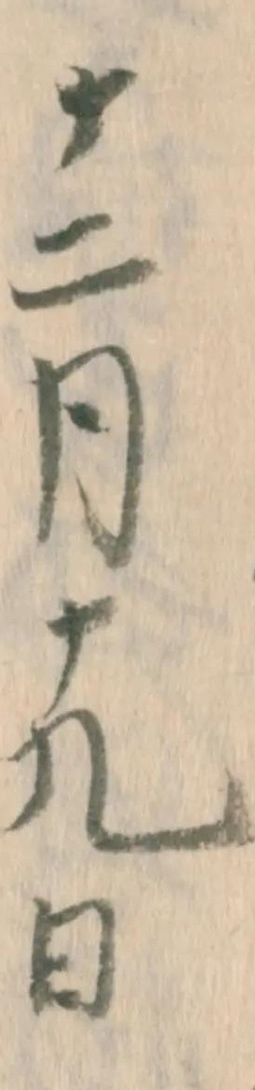十二月十九日
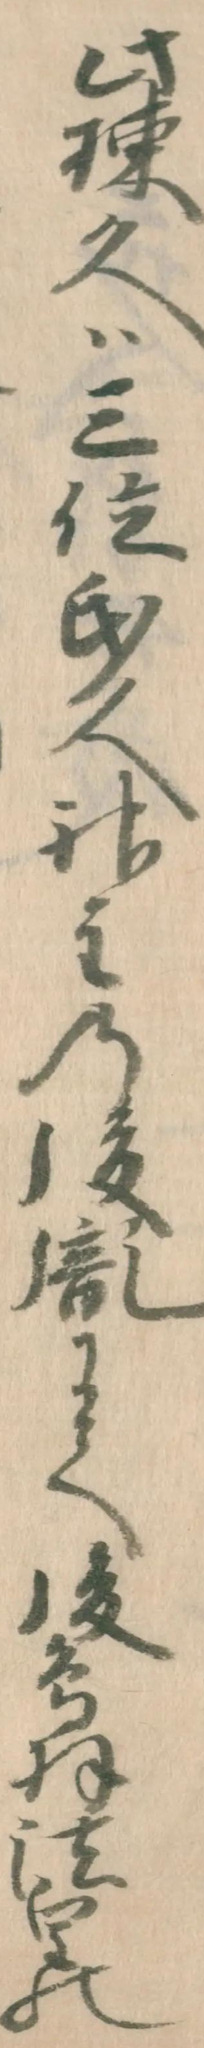此棟久は三位氏久神主の後胤にて後鳥羽法皇の
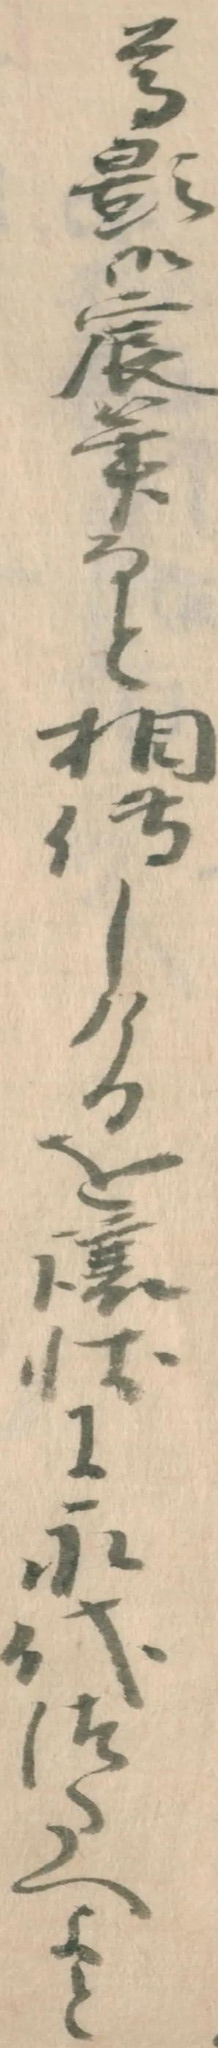尊影御宸筆なと相伝しけるを譲状に永代つたへよと
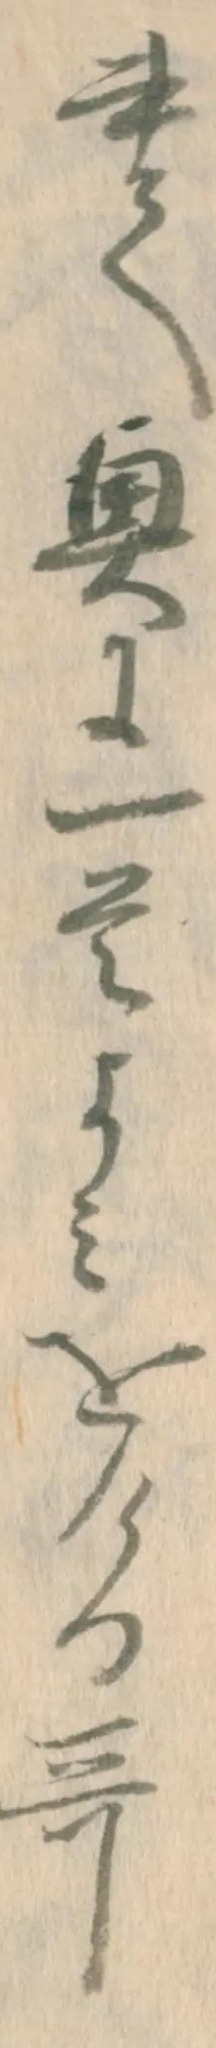書て奥に一首よみをける哥
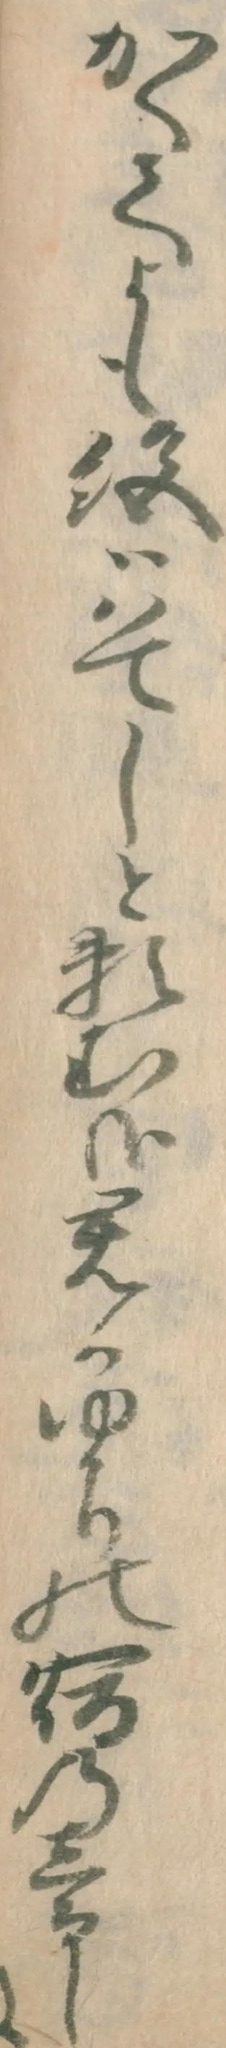かくてよも絶ははてしと頼む哉君かゆかりの宿のしるしに

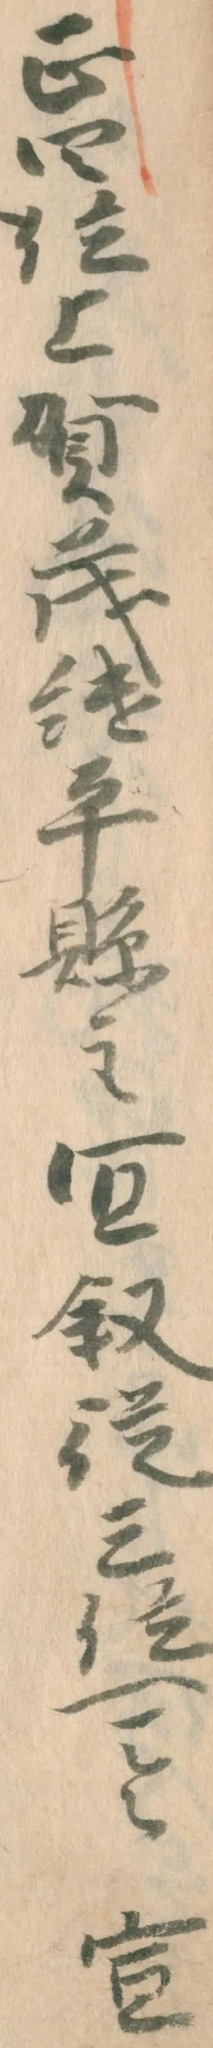正四位上賀茂継平県主宜叙従三位可令宣
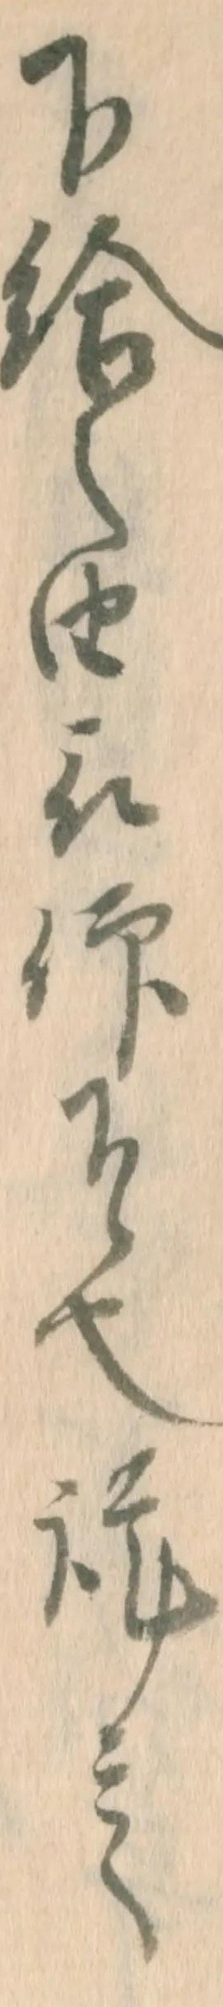下給之由被仰下候也謹言
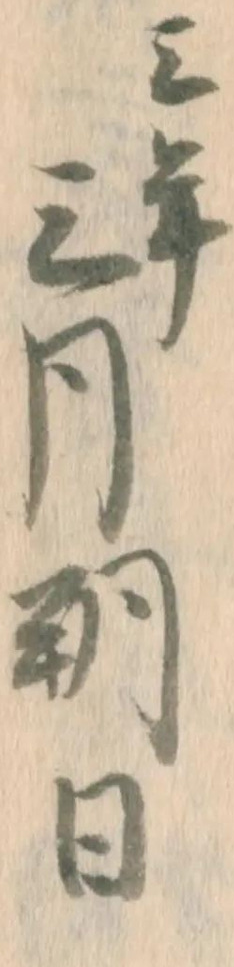三月朔日
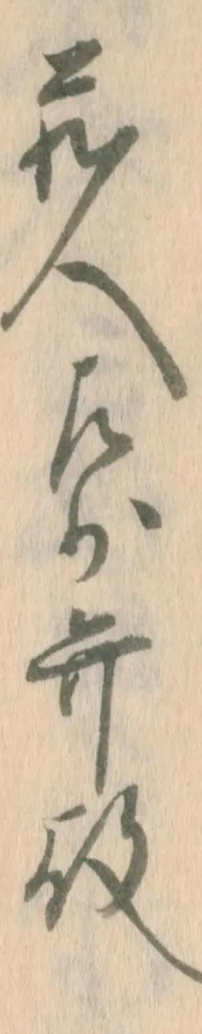蔵人左少弁殿
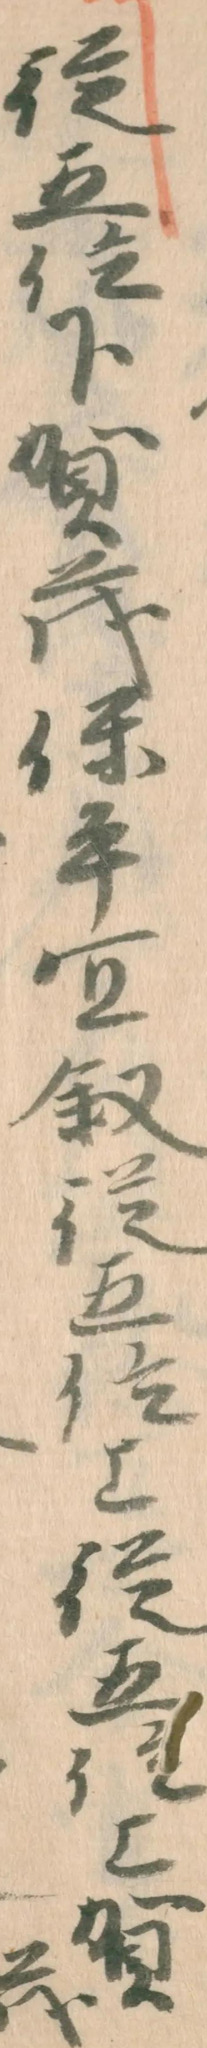従五位下賀茂保平宜叙従五位上従五位上賀茂
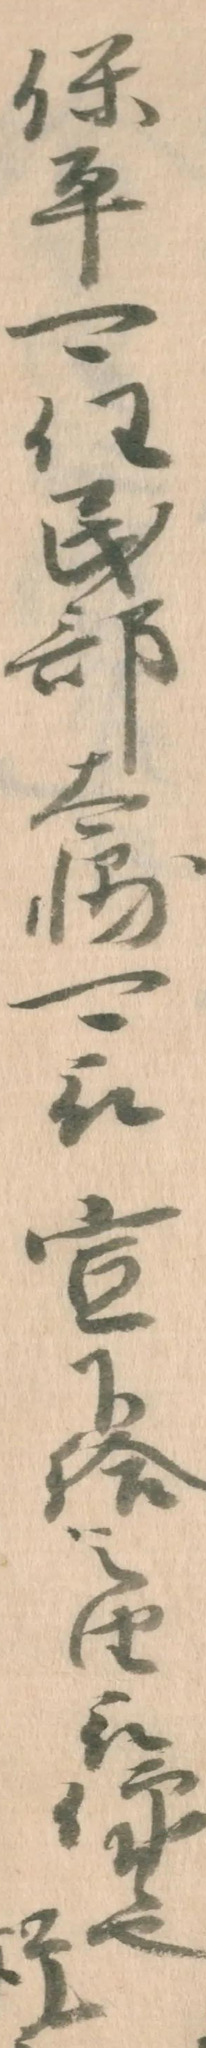保平可任民部太輔可被宣下給之由被仰下候也謹言
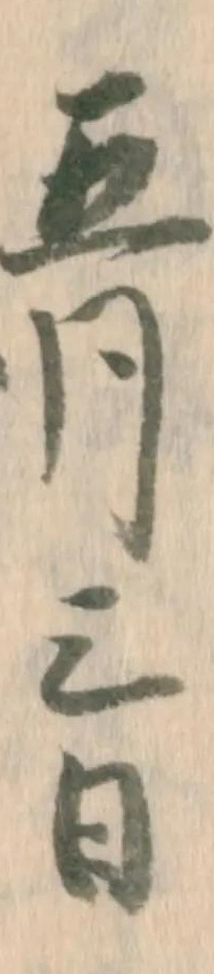五月三日
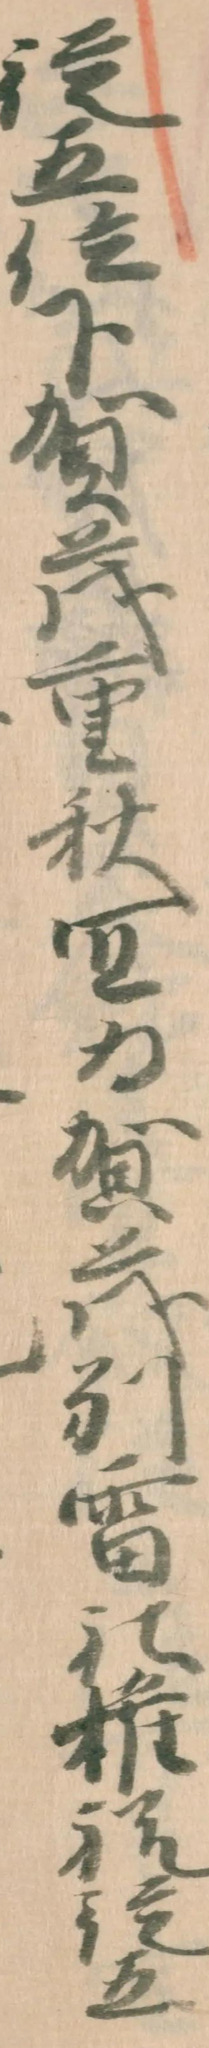従五位下賀茂重秋宜為賀茂別雷社権祝従五
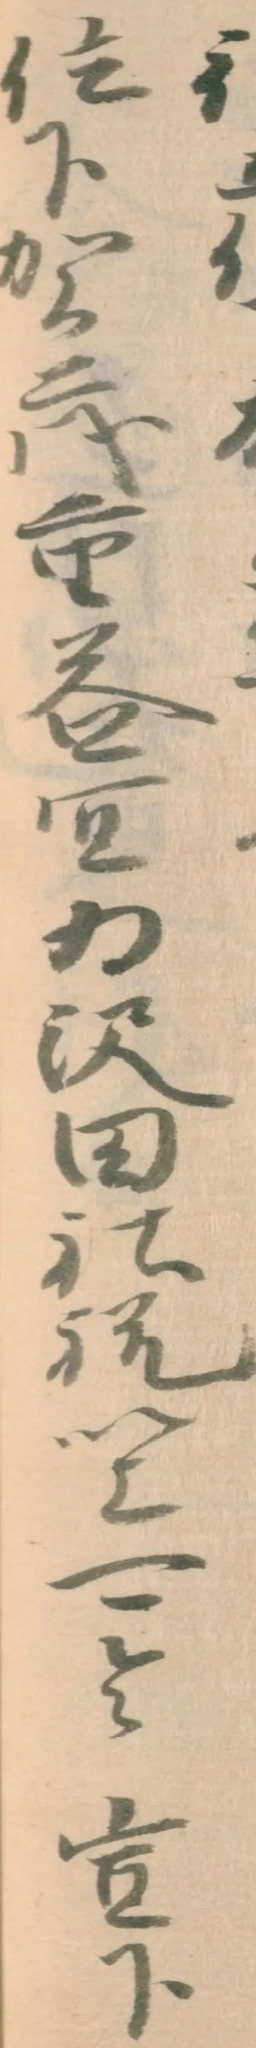位下賀茂重益宜為沢田社祝以上可令宣下
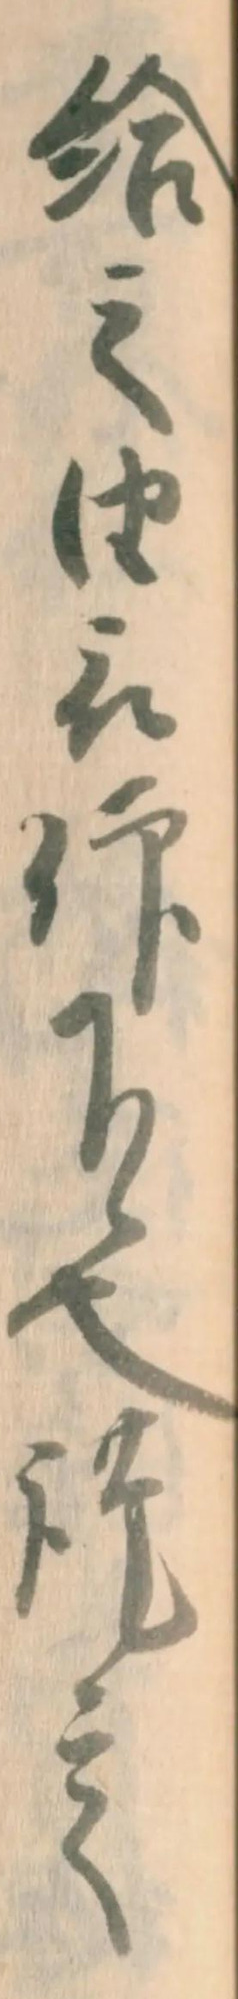下給之由被仰下候也謹言
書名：賀茂社記録. 第1冊
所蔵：国立国会図書館 National Diet Library, JAPAN
